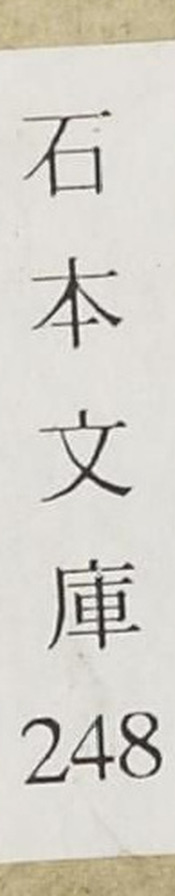石本文庫
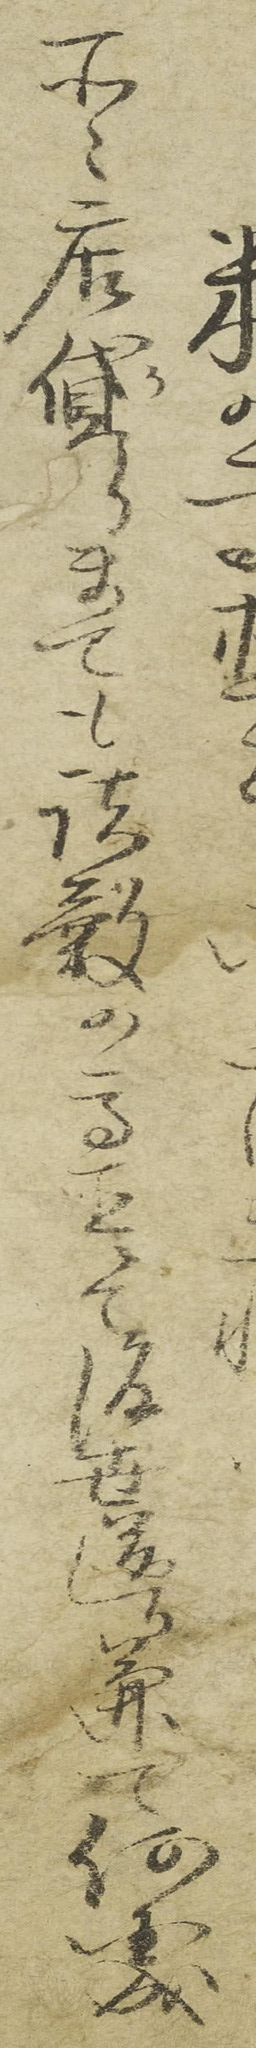所々店貸りまても諸穀の高直ニて渡世送り兼て何国成
